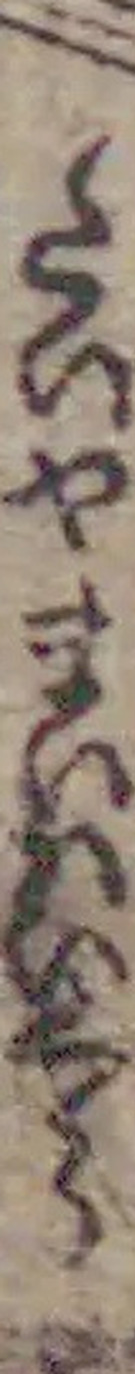たいやまいはいくら
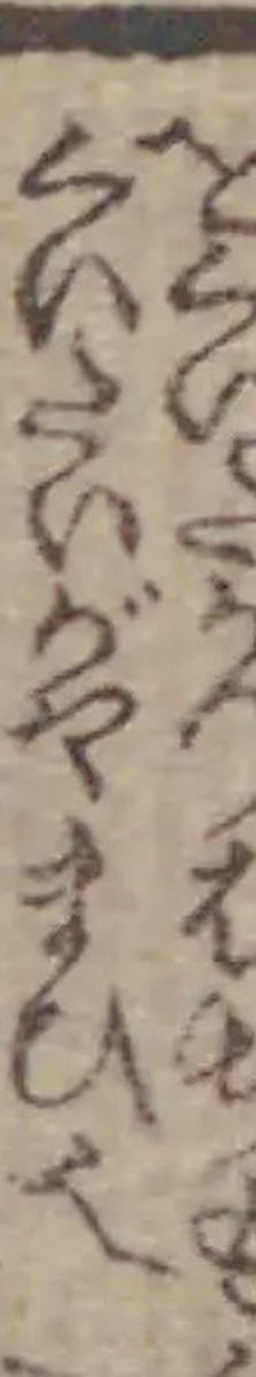くいたいがやまひ也
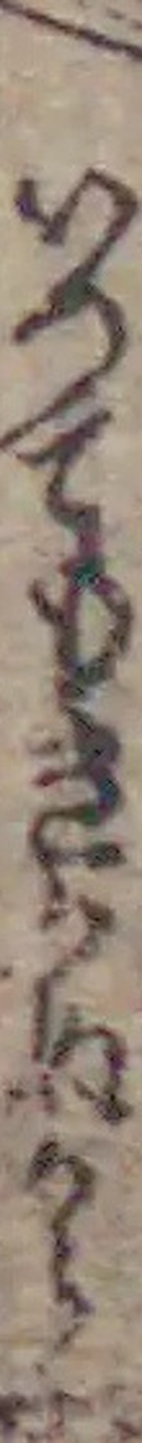いつてもきかぬから
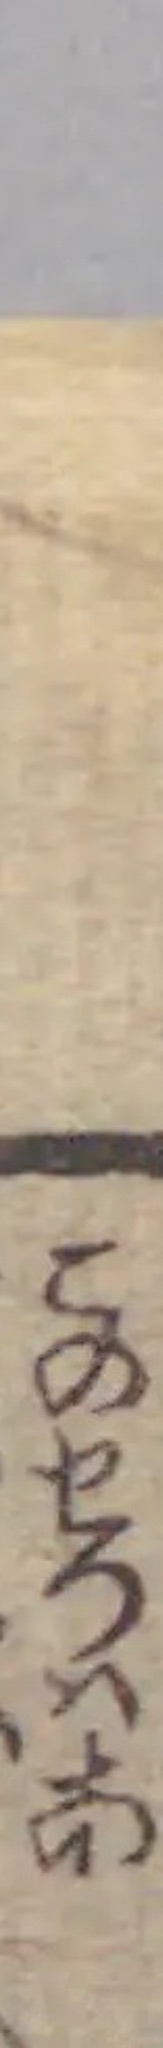このせつはあ
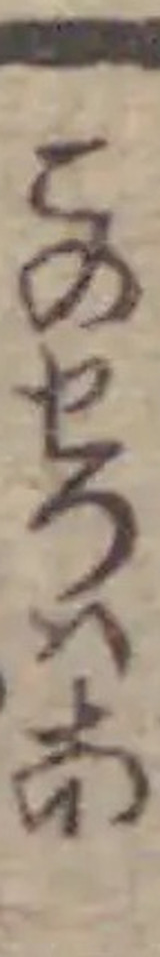このせつはあ
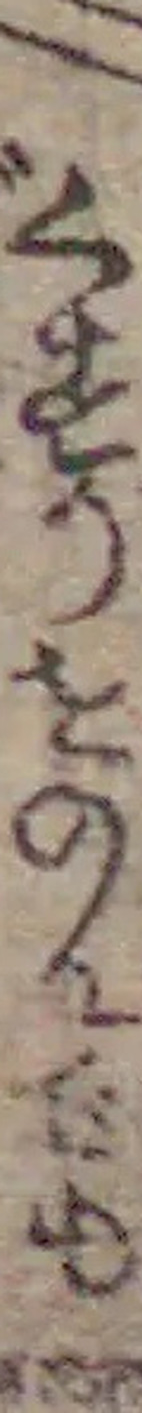くすりをのんでも
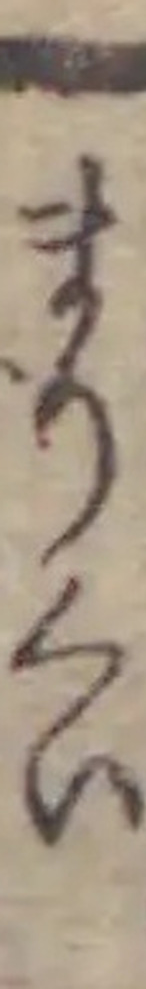まりくい
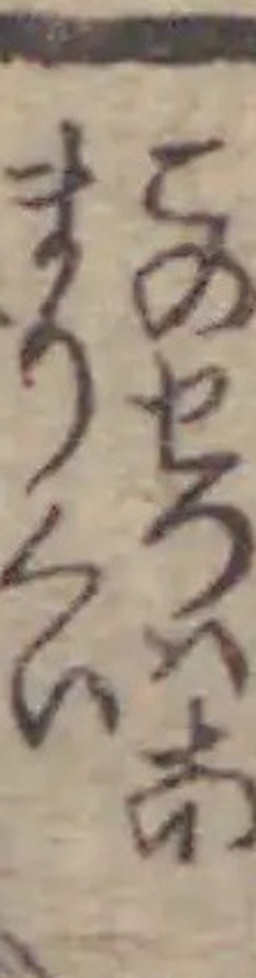まりくい
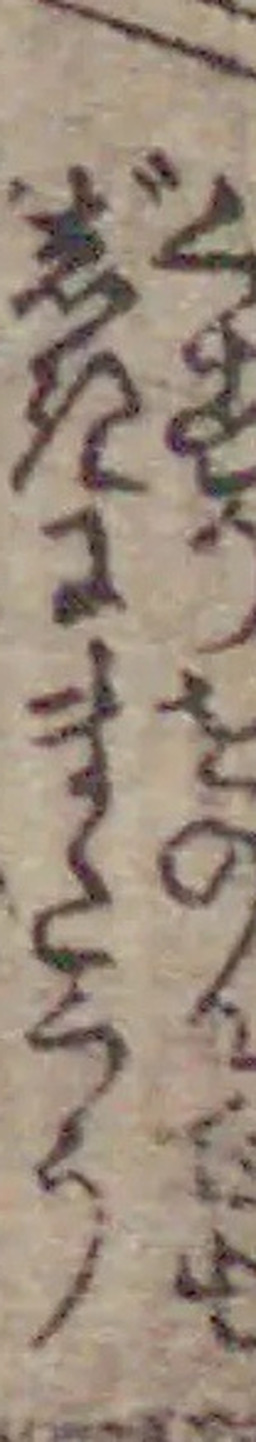じきにまたくう
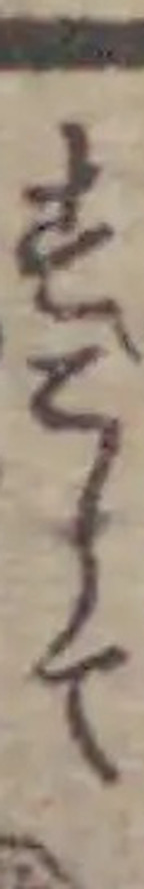すごして
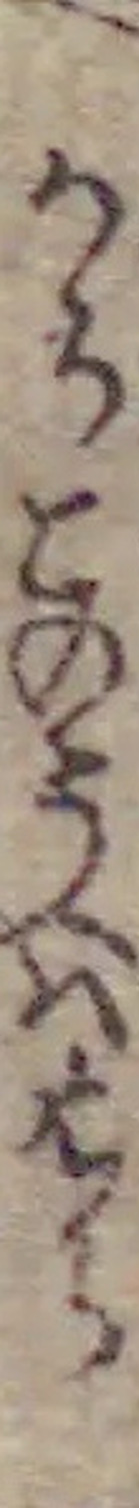からこのうへははら
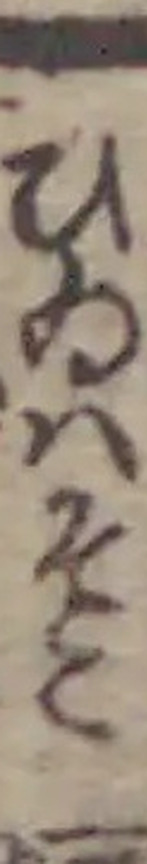ひゐはそこ
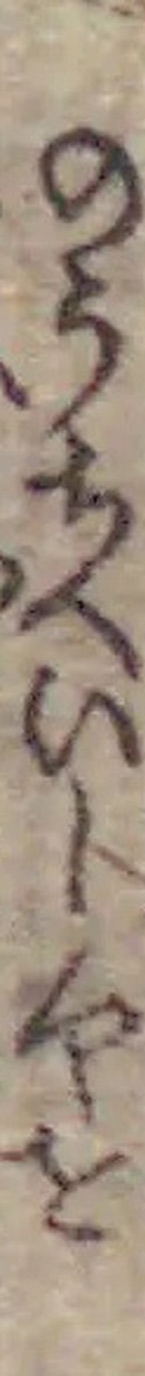のうちへいしやを
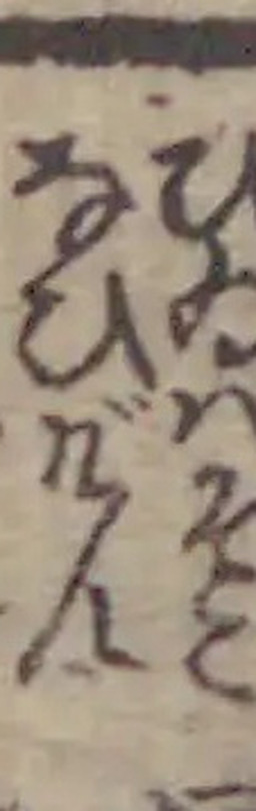なひげん
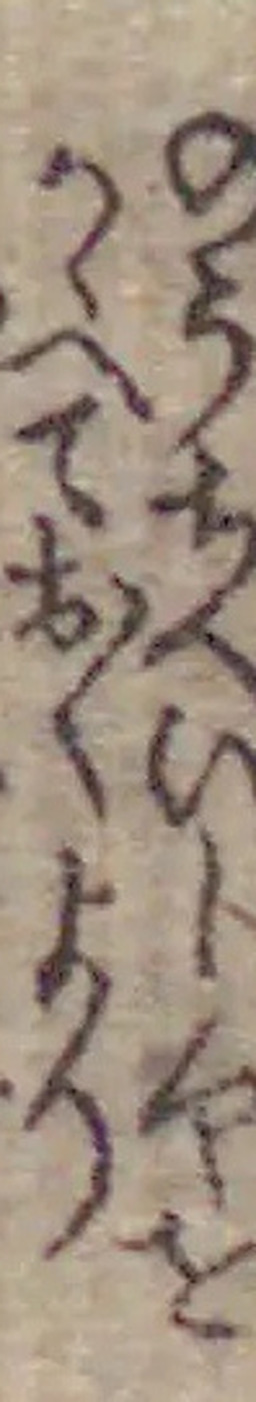かかへておくより
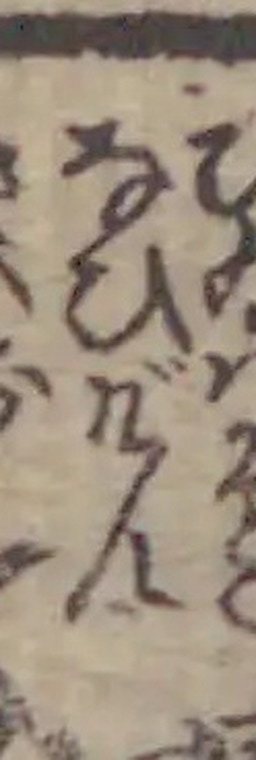なひげん
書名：腹内養生主論 3巻
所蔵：国立国会図書館 National Diet Library, JAPAN
